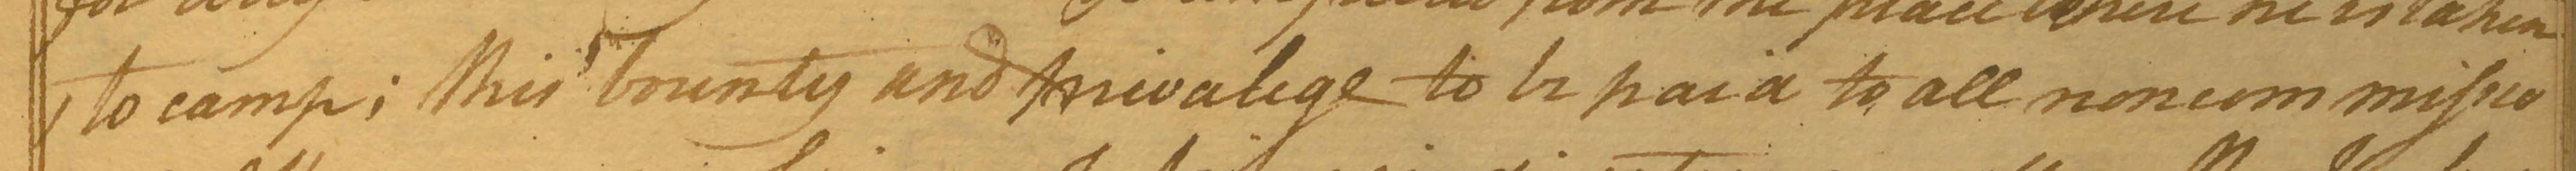to camp; this bounty and privalege to be paid to all noncommisio
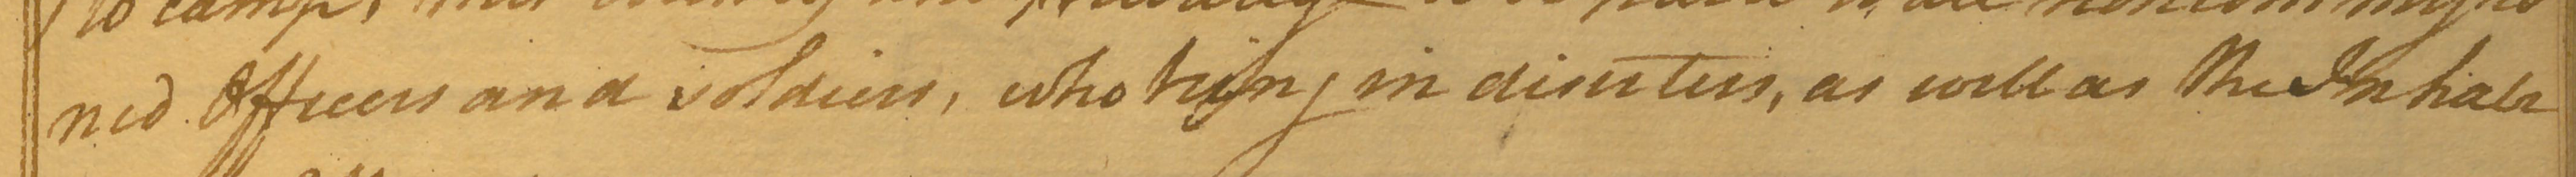ned Officers and soldiers, who bring in diserters, as well as the Inhabi
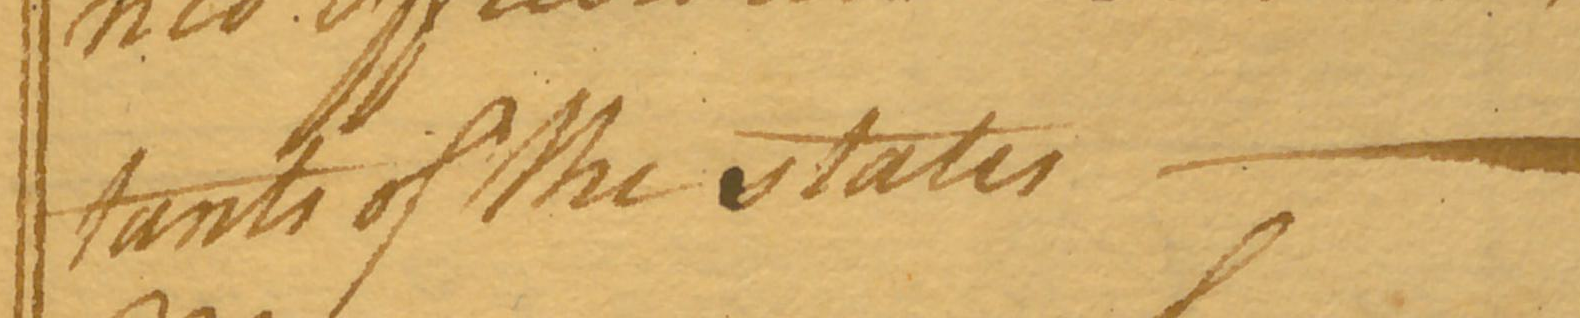tants of the states-
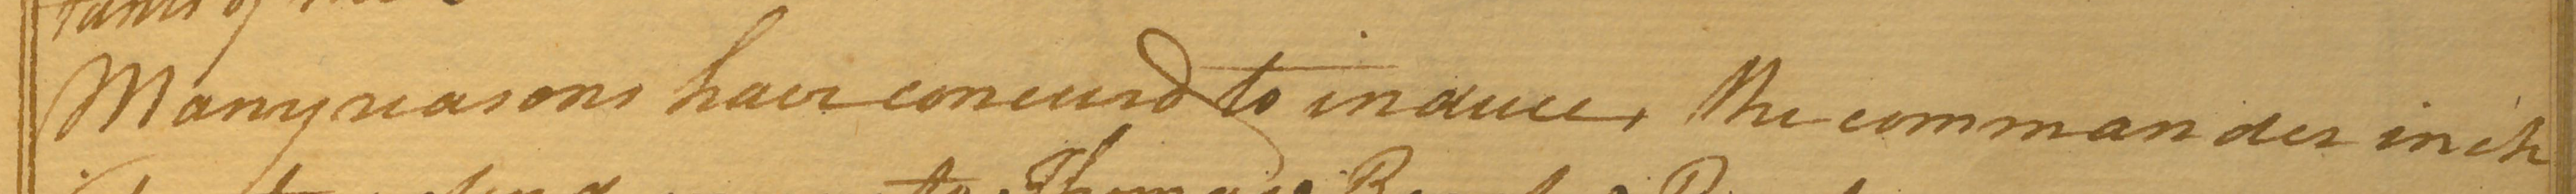Many reasons have concurd to induce, the commander in ch
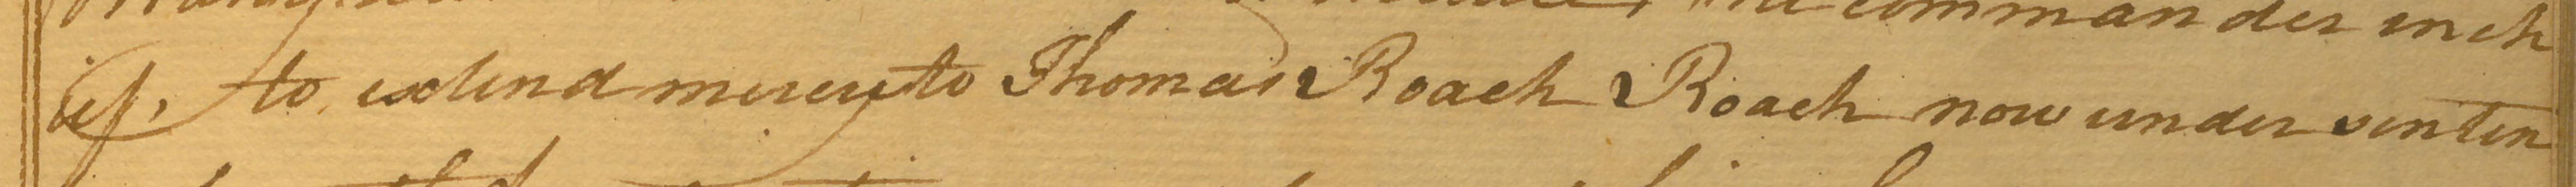ief, to extend mercy to Thomas Roach Roach now under sente
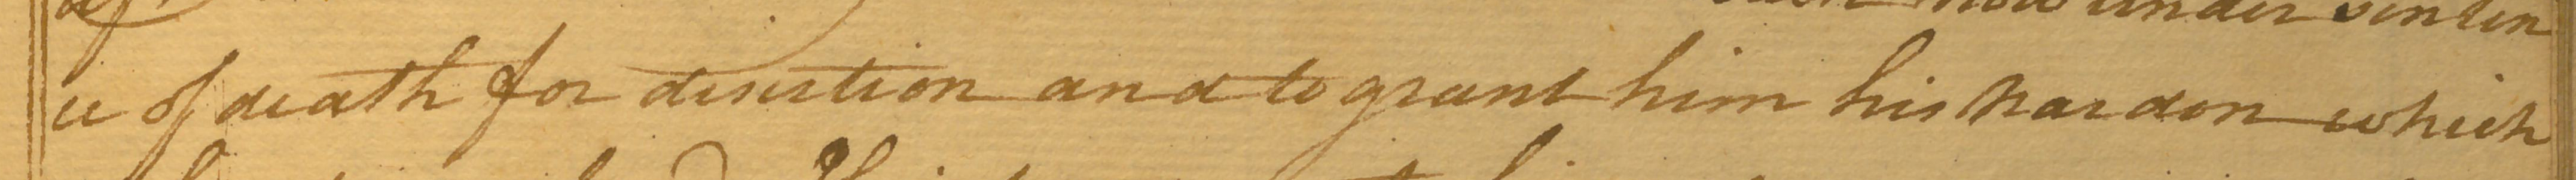ce of death for disertion and to grant him pardon which
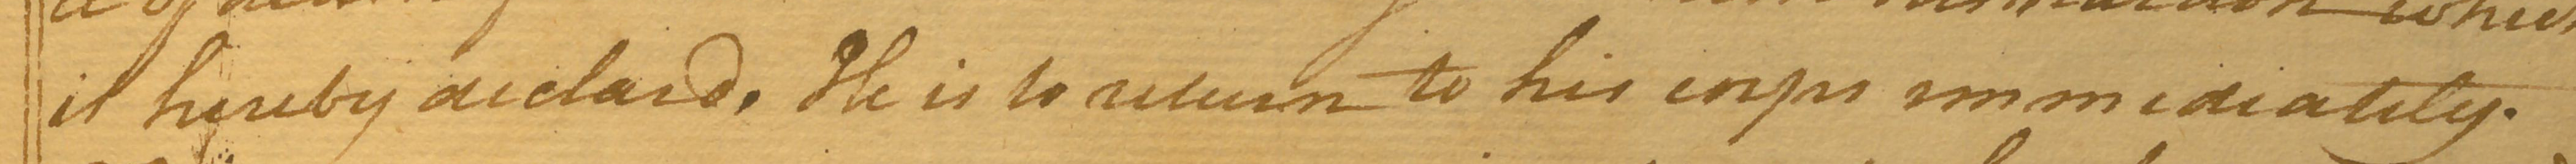is hereby declard. He is to return to his corps immediately.
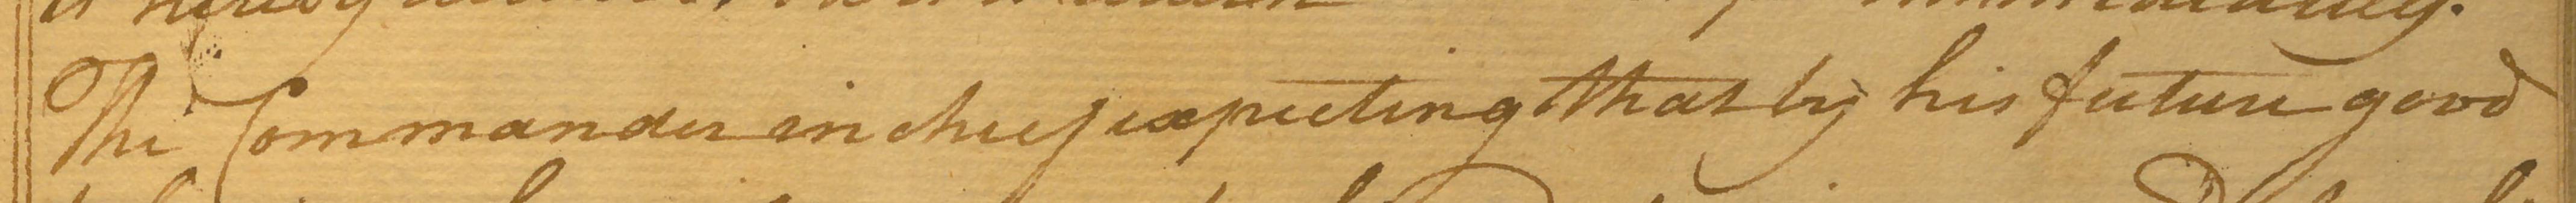The Commander in chief expecting that by his fortune good
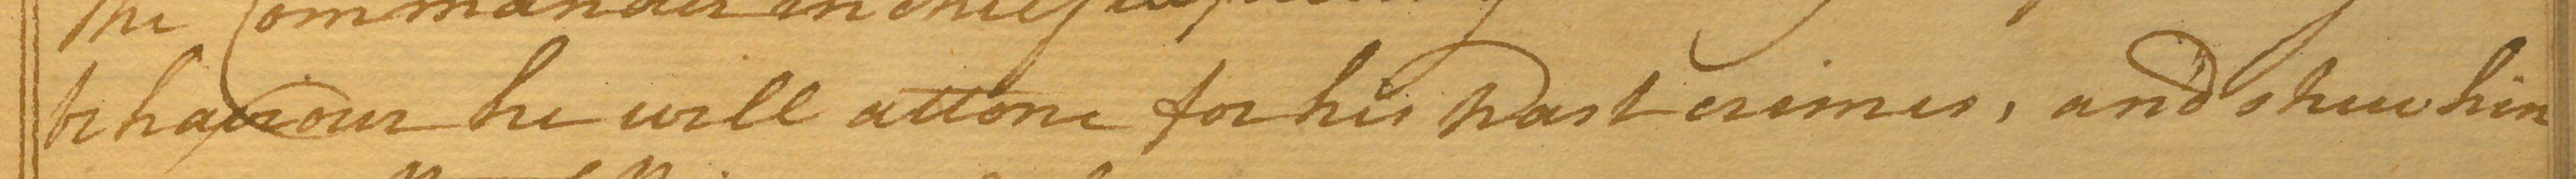behavior he will attone for his past crimes, and shew him
